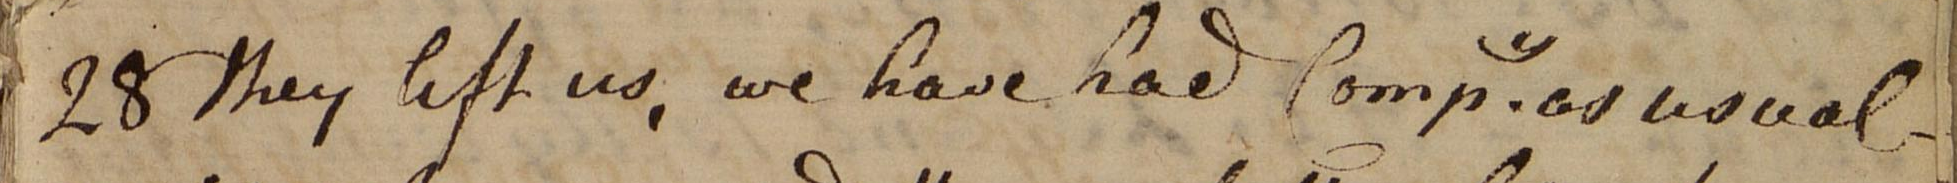28 they left us, we have had Comp^y. as usual
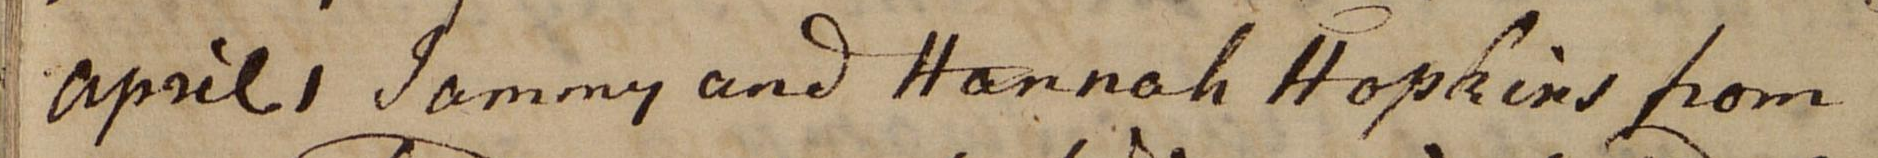April, Sammy and Hannah Hopkins from
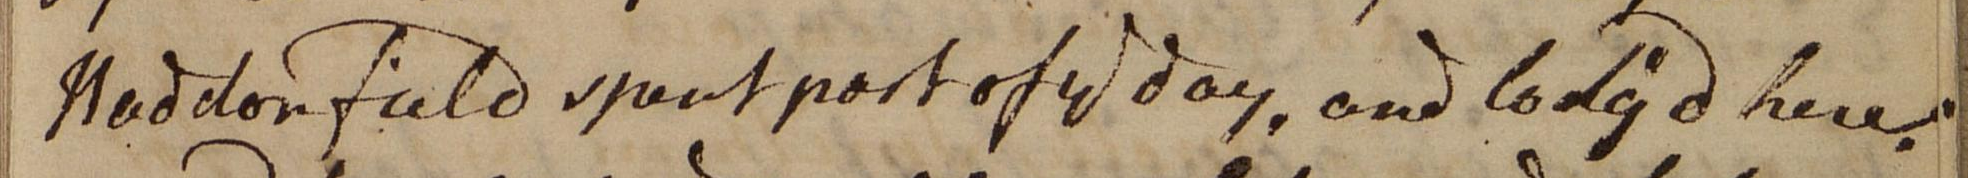Haddonfield spent part of y^e day, and lodg'd here,
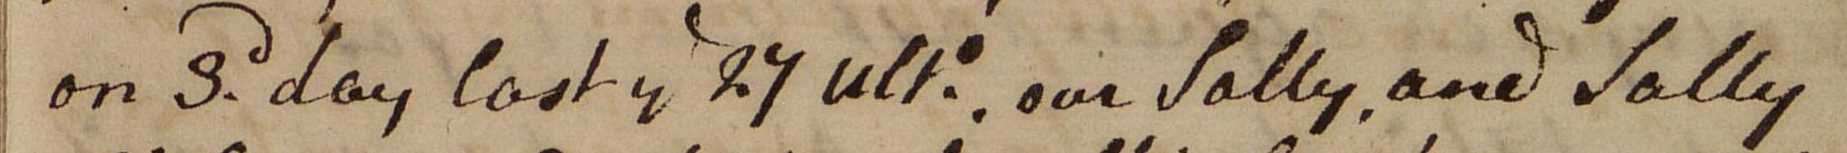on 3^d. day last y^e 27 Ult^o. our Sally and Sally
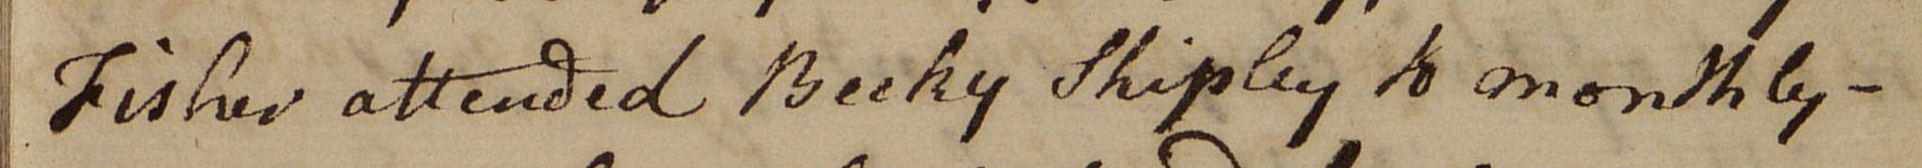Fisher attended Becky Shipley to monthly-
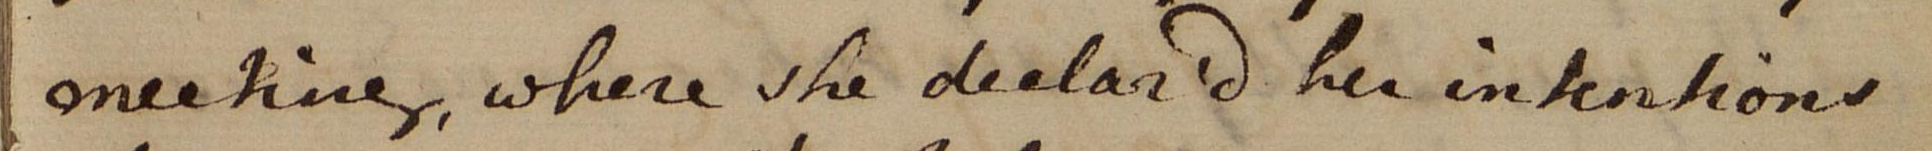meeting, where she declar'd her intentions
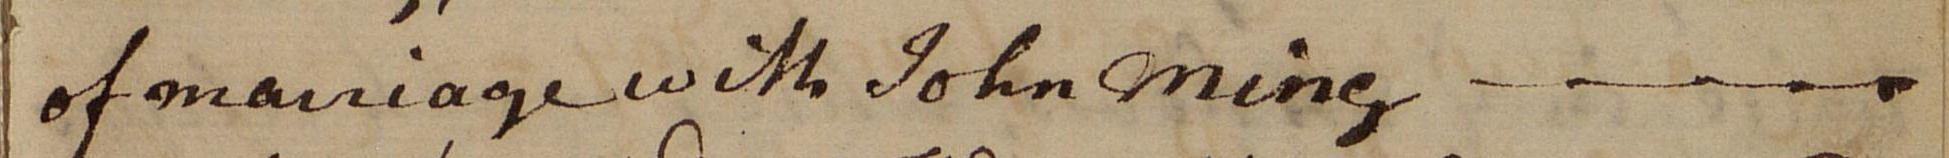of marriage with John Ming-
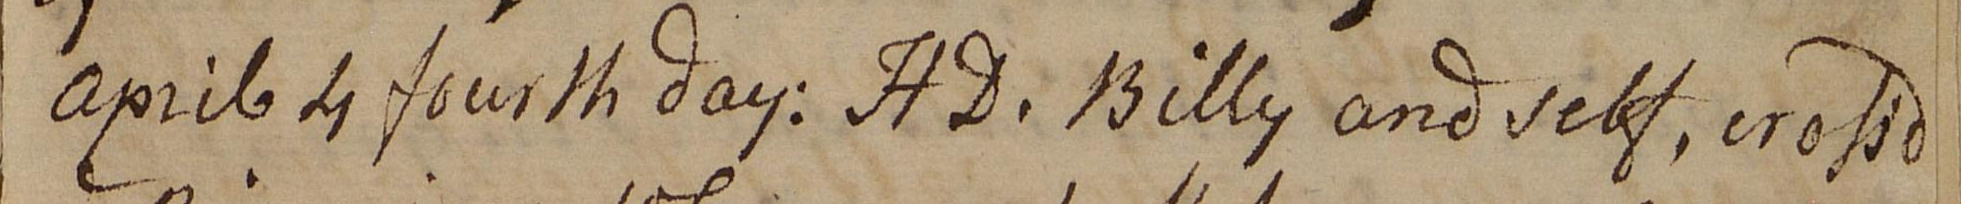April 4 fourth day: HD. Billy and self, cross'd
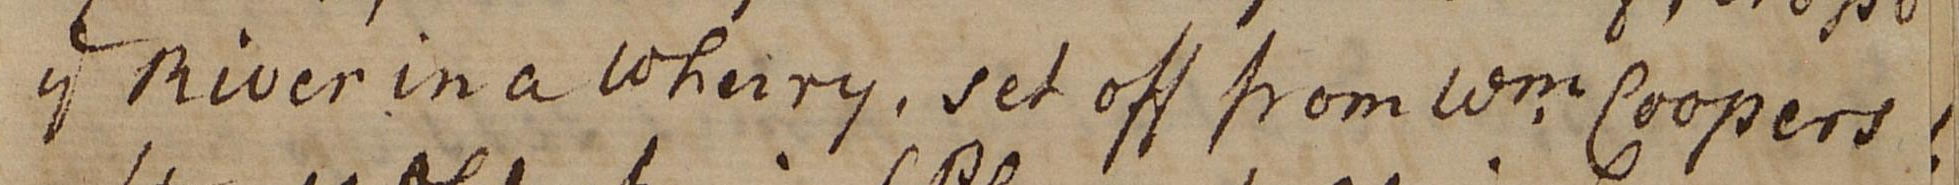y^e River in a Wherry, set off from W^m Coopers
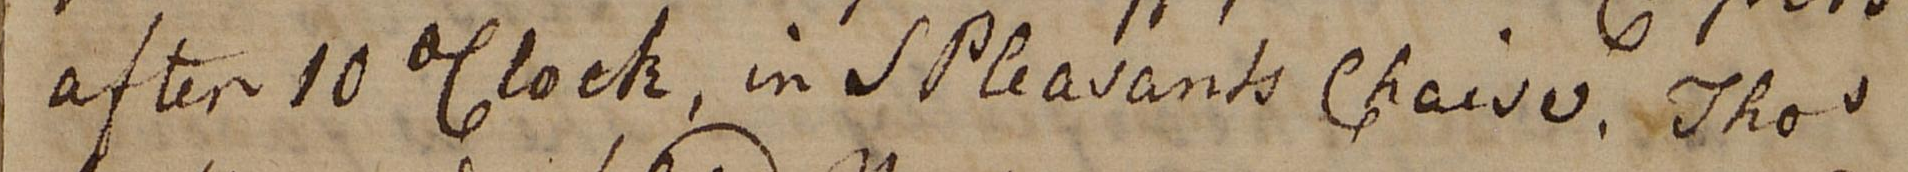after 10 ^o Clock, in S Pleasants Chaises, Tho^s
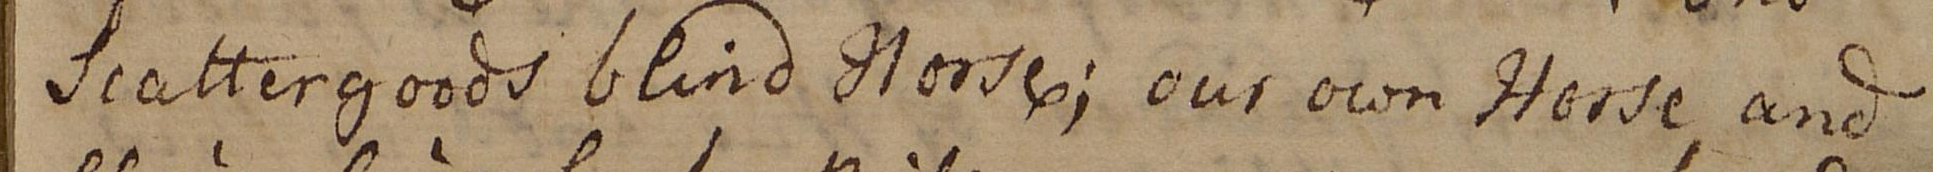Scattergoods blind Horses; our own Horse and
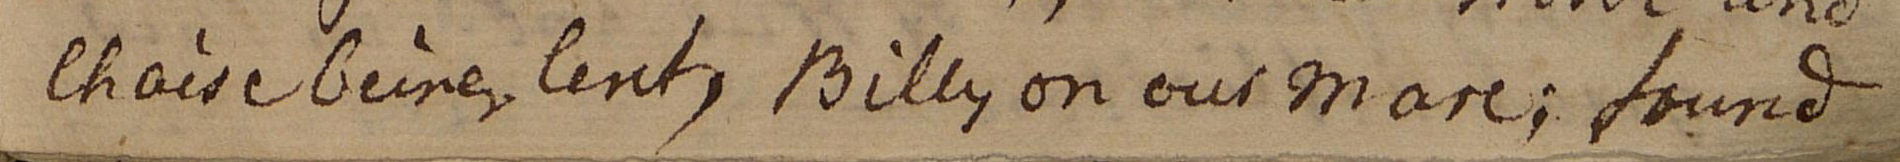Chaise being lent, Billy on our mare; found
